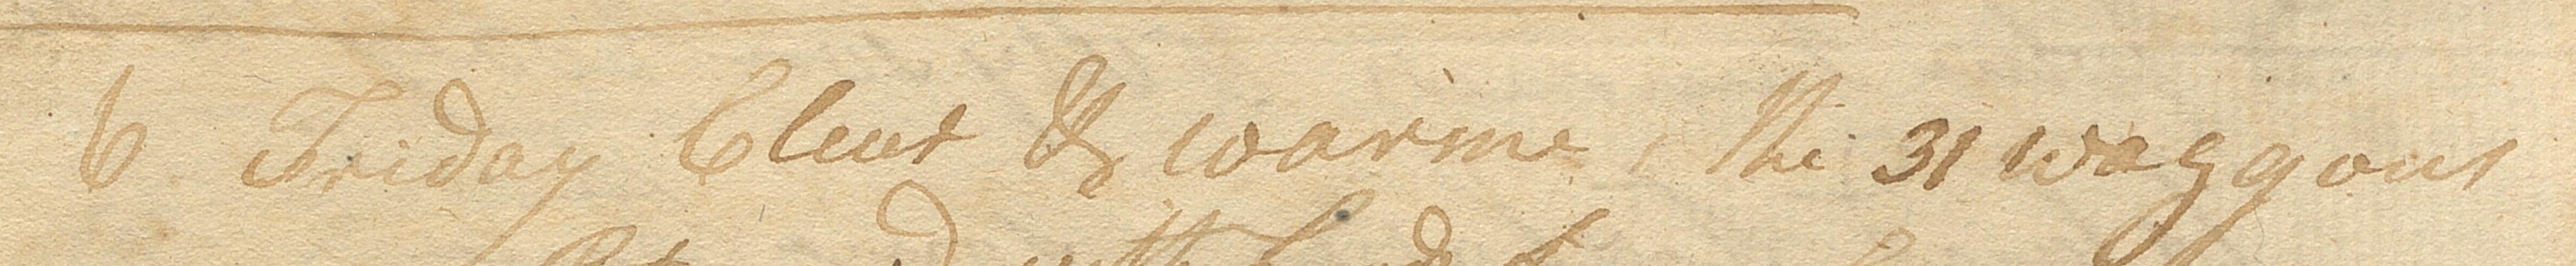6 Friday Clear & warme the 31 waggons
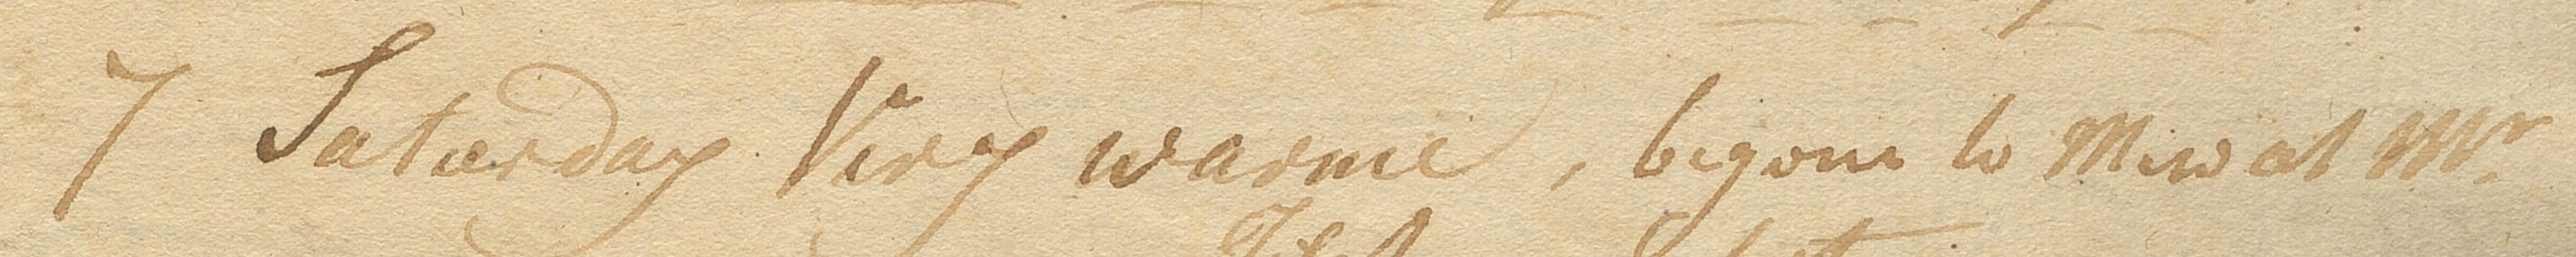7 Saturday Very warme, begon to Mow at M^r.
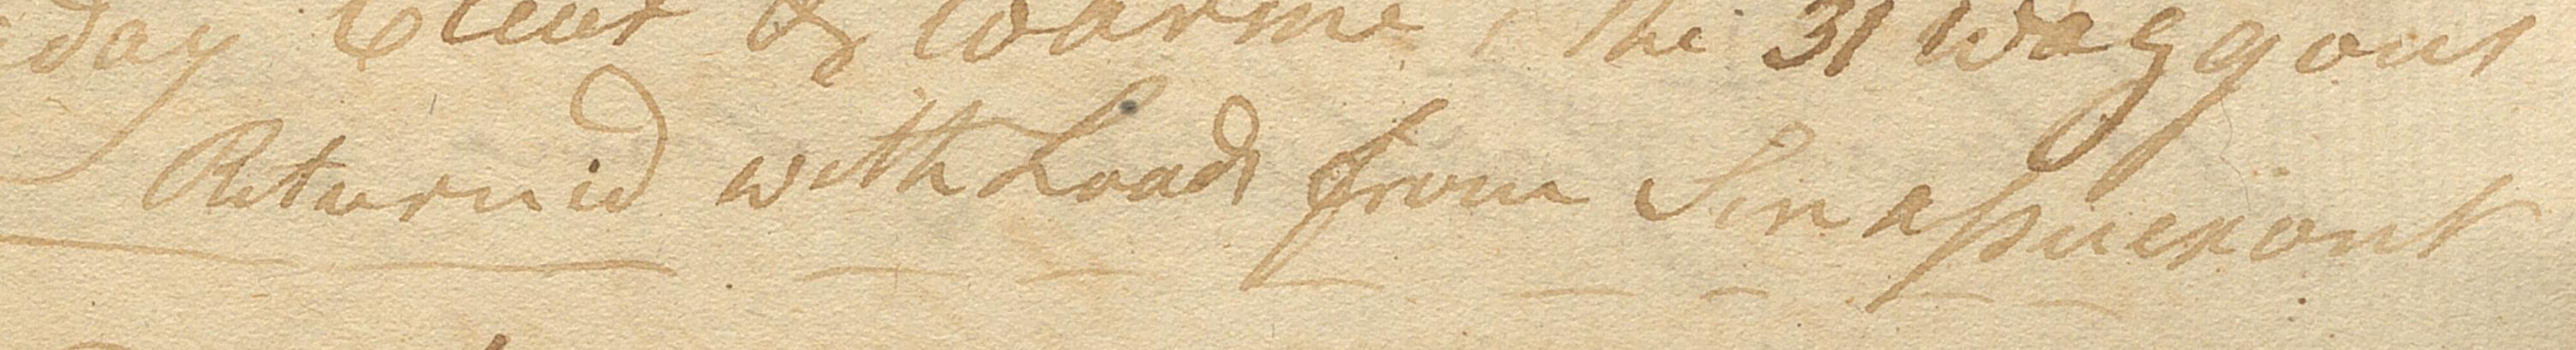Returned with Loads from Sinapuresont
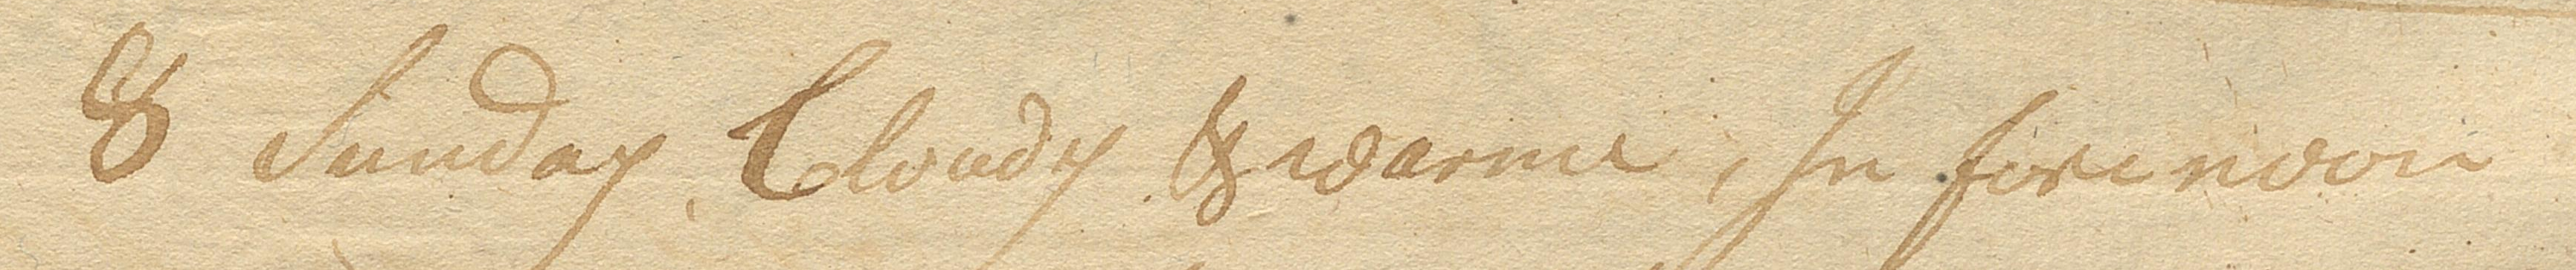8 Sunday Cloudy & warme, In forenoon
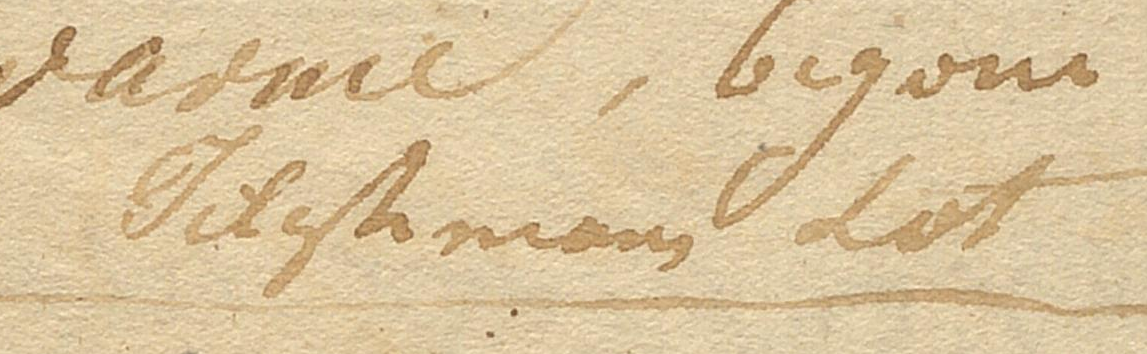Tilghmans Lot
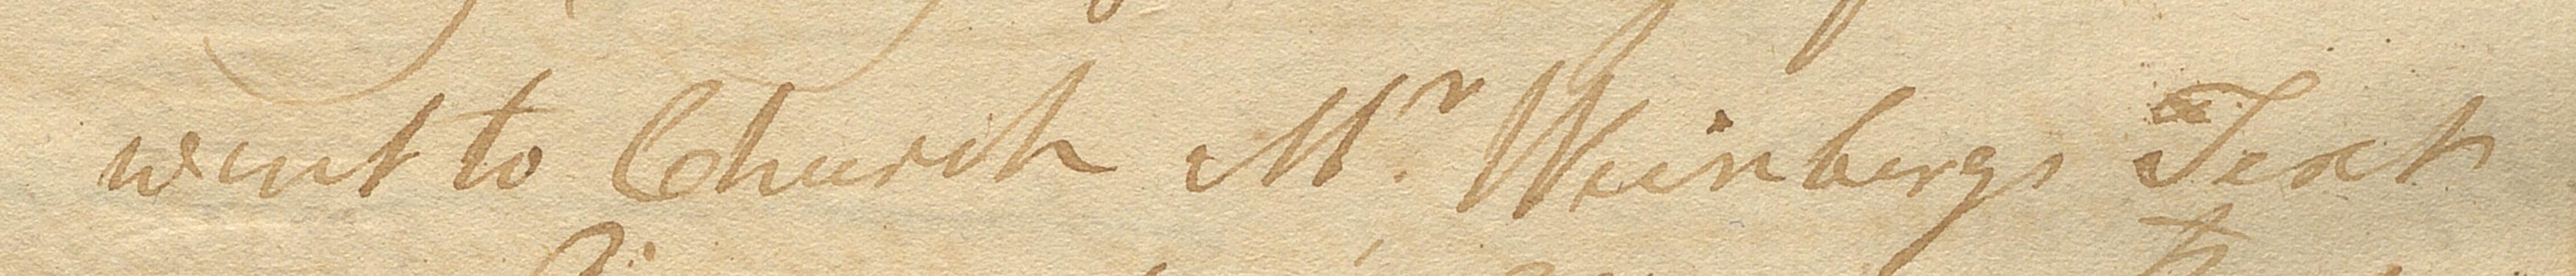went to Church M^r. Weinbergs Text
